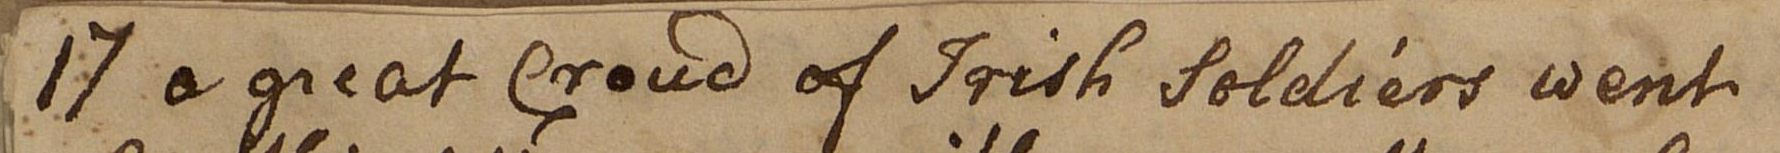17 a great Croud of Irish Soldiers went
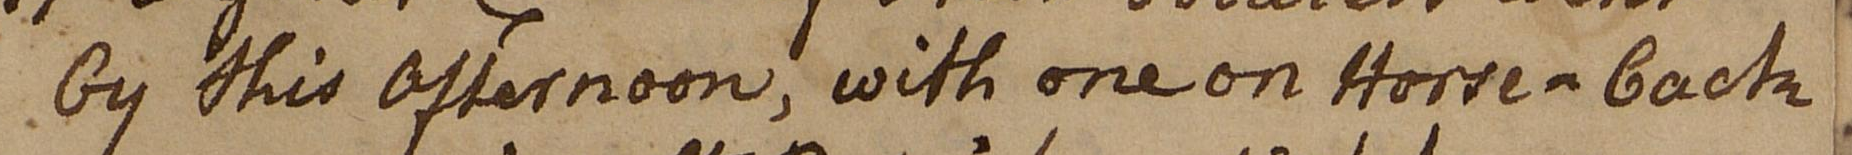by this afternoon, with one on Horse-back
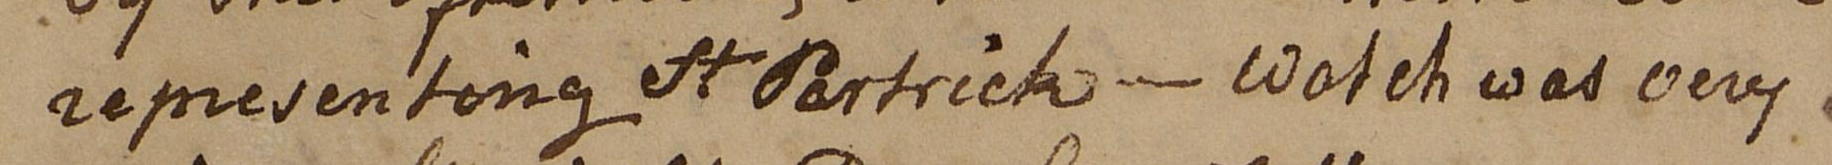representing S^t. Partrick- Watch was very
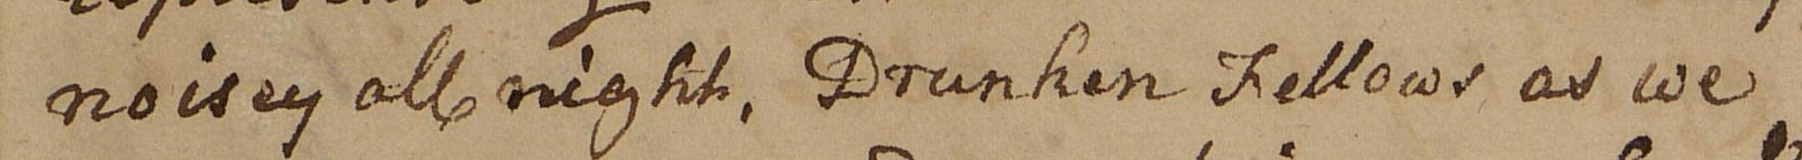noisey all night, Drunken Fellows as we
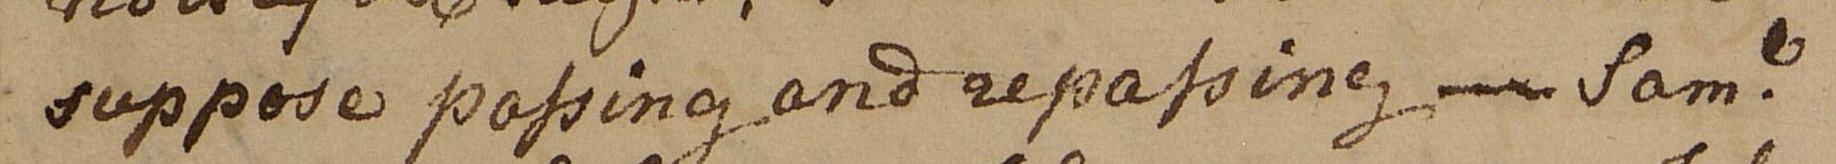suppose passing and repassing- Sam^l.
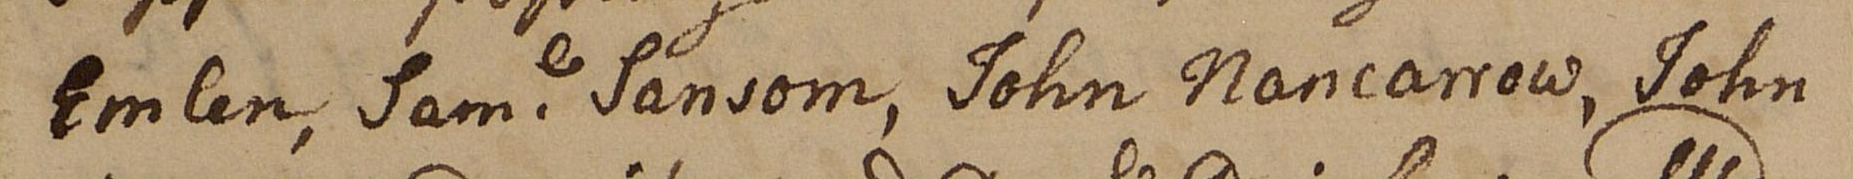Emlen, Sam^l. Sansom, John Nancarrow, John
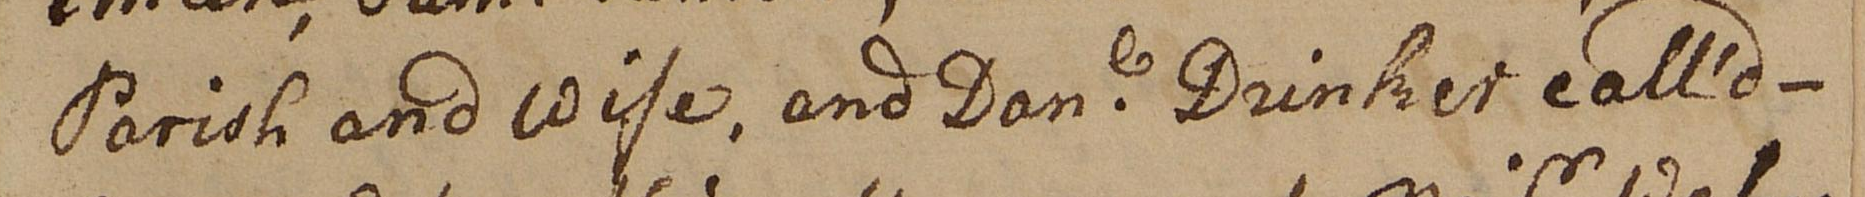Parish and wife, and Dan^l. Drinker call'd-
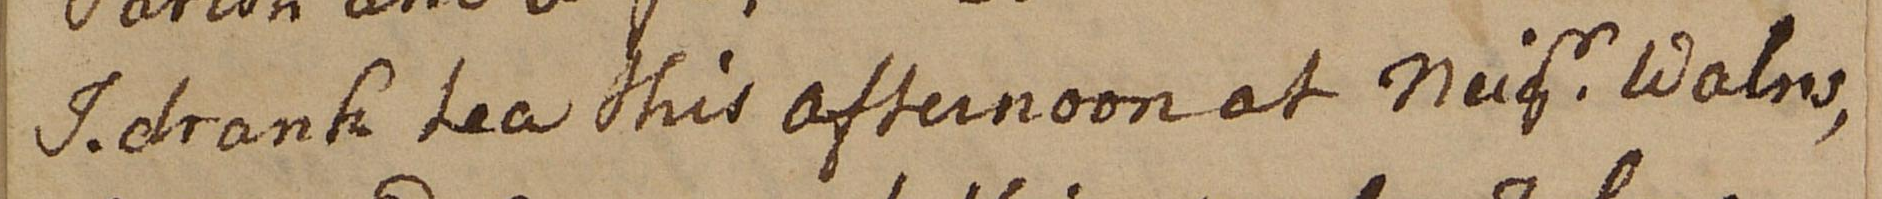I. drank tea this afternoon at Neig^r. Walns,
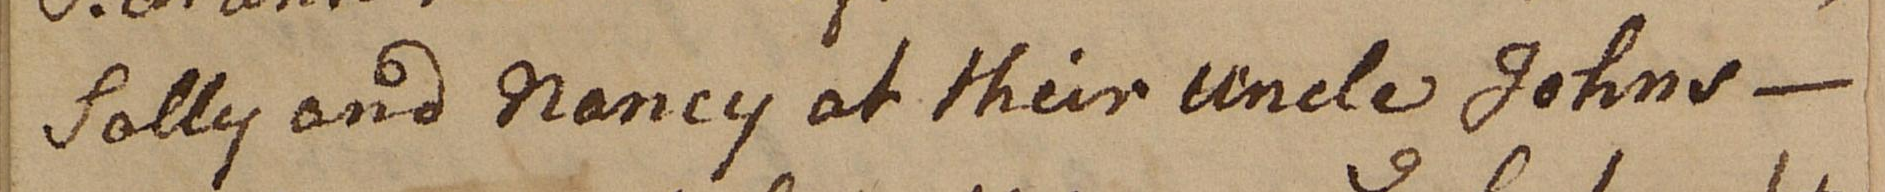Sally and Nancy at their Uncle Johns-
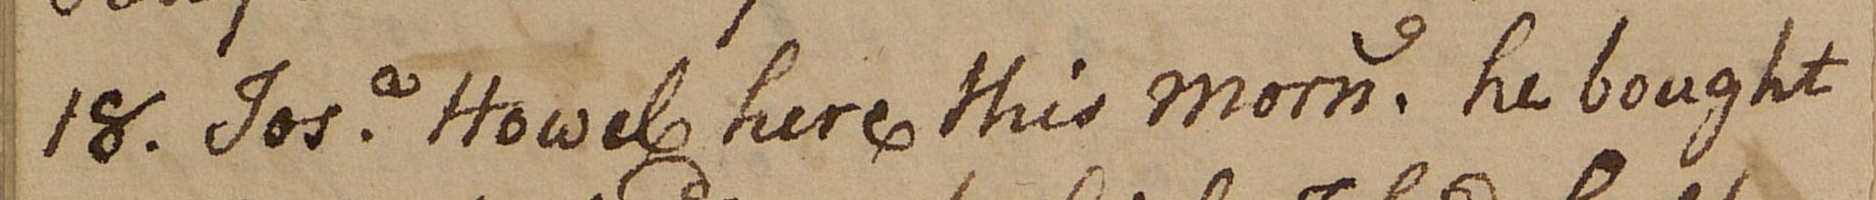18. Jos^a. Howel here this morn^g. he bought
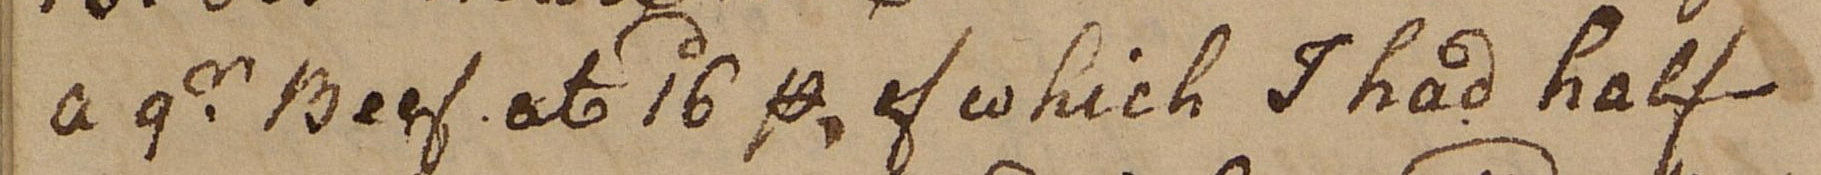a q^r. Beef at 16 per of which I had half
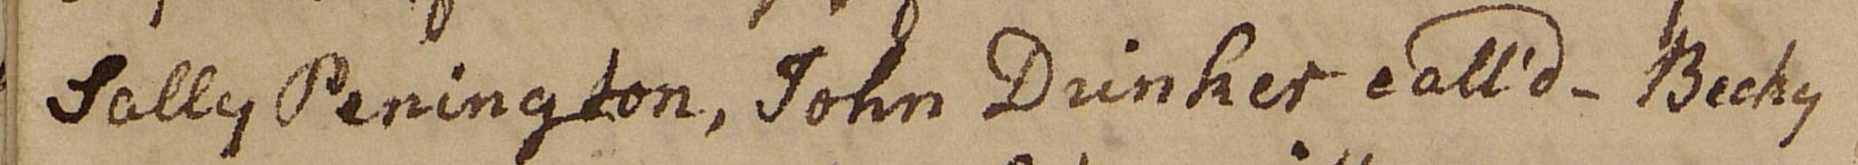Sally Penington, John Drinker call'd- Becky
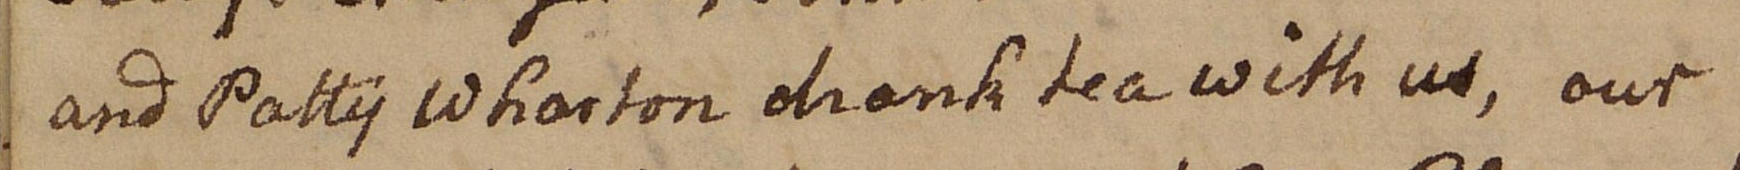and Patty Wharton drank tea with us, our
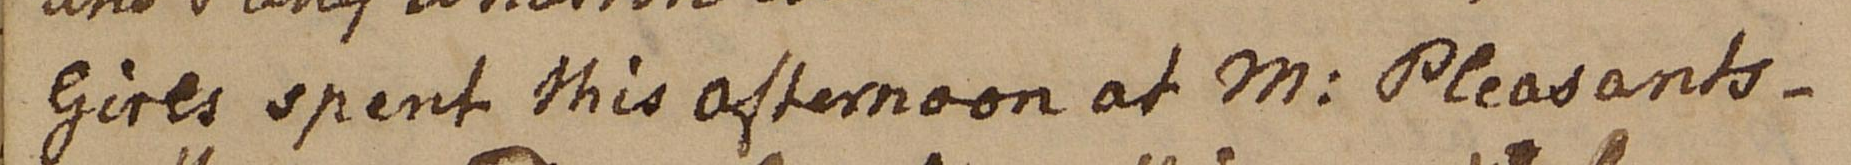Girls spent this afternoon at M: Pleasants-
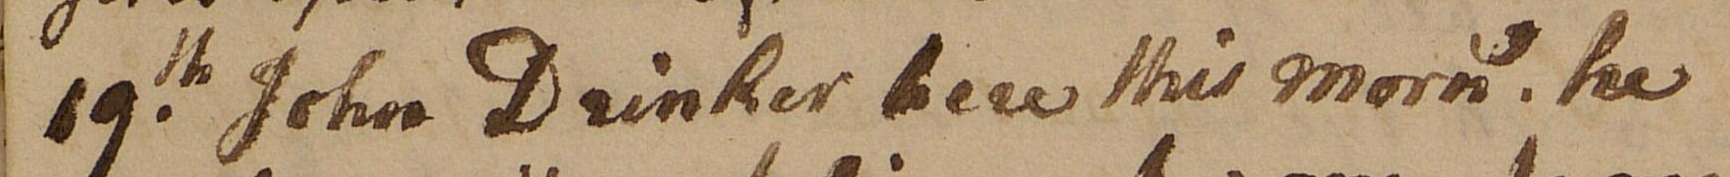19^th. John Drinker here this morn^g. he
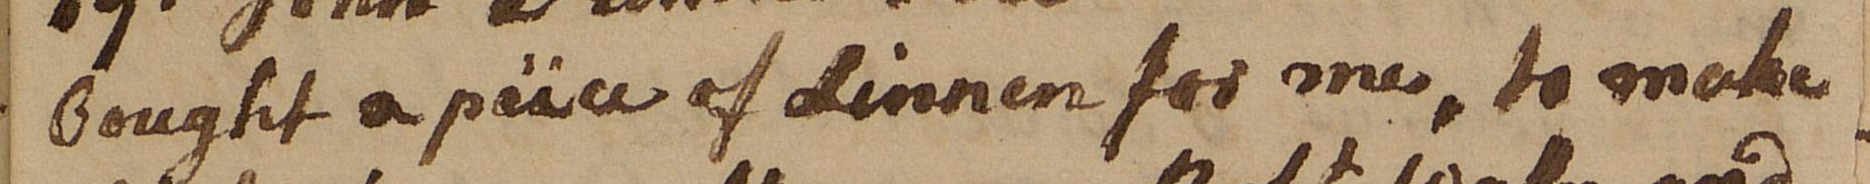bought a peice of Linnen for me, to make
